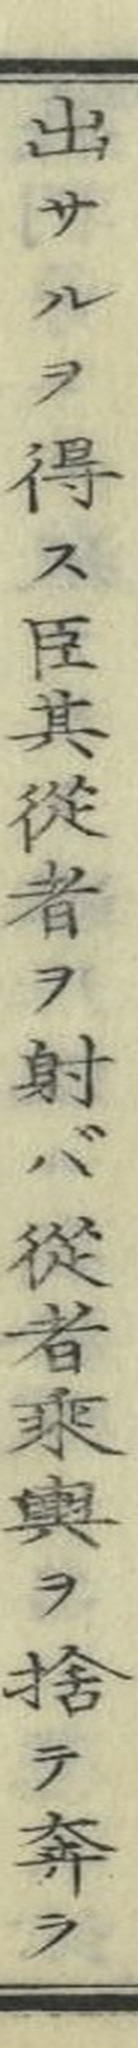出サルヲ得ス臣其從者ヲ射バ從者乘輿ヲ捨テ奔ラ
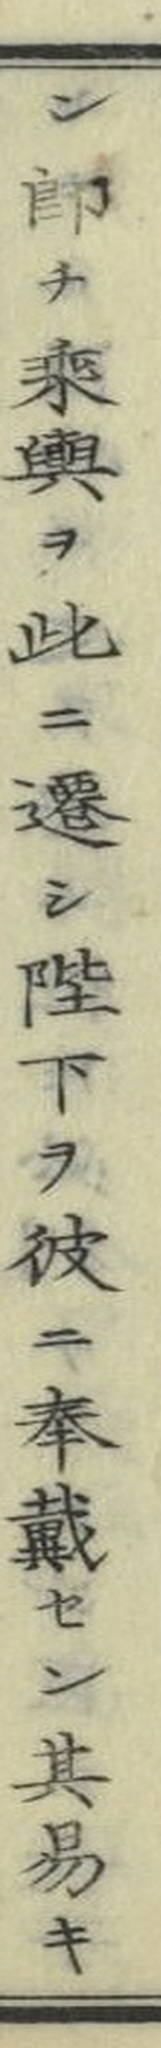シ即チ乘輿ヲ此ニ遷シ陛下ヲカレニ奉戴セン其易キ
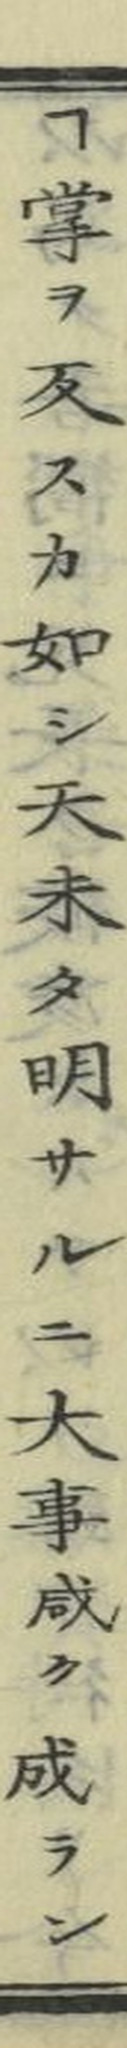コト掌ヲ反スカ如シ天未タ明サルニ大事咸ク成ラン
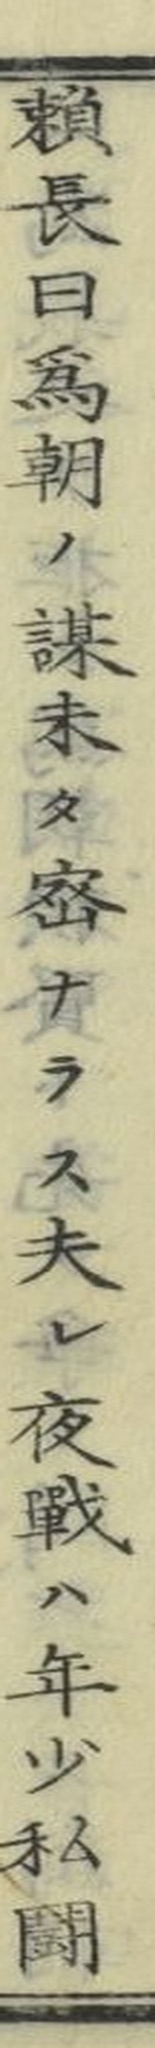頼長曰爲朝ノ謀未タ密ナラス夫レ夜戰ハ年少私闘
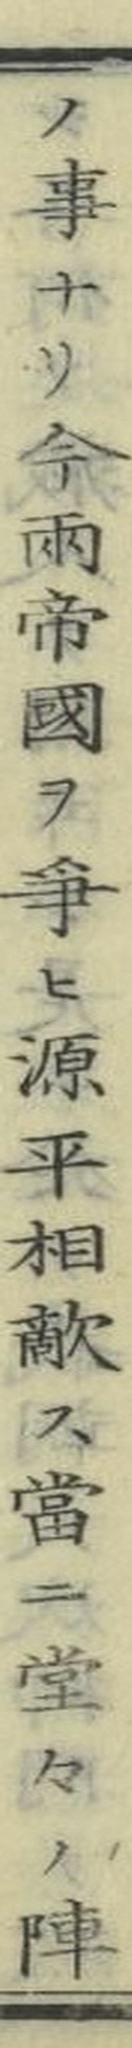ノ事ナリ今兩帝國ヲ爭ヒ源平相歒ス當ニ堂々ノ陣
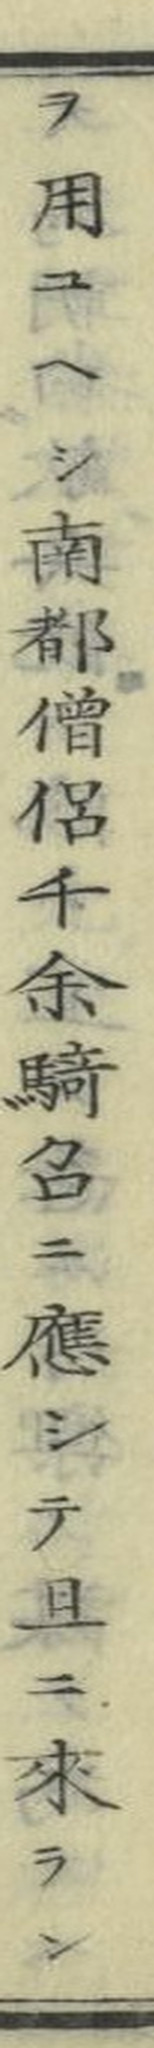ヲ用ユヘシ南都僧侶千余騎召ニ應シテ旦ニ來ラン
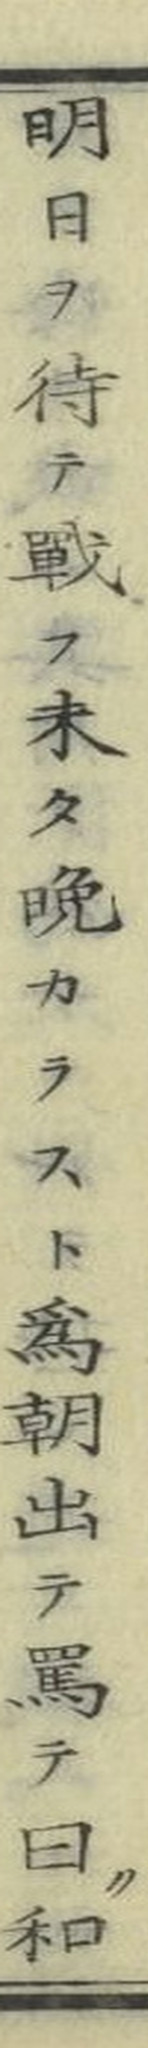明日ヲ待テ戰フ未タ晩カラスト爲朝出テ罵テ曰和
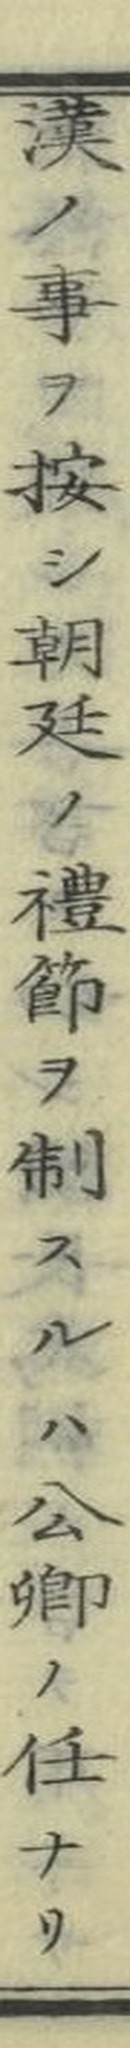漢ノ事ヲ按シ朝廷ノ禮節ヲ制スルハ公卿ノ任ナリ
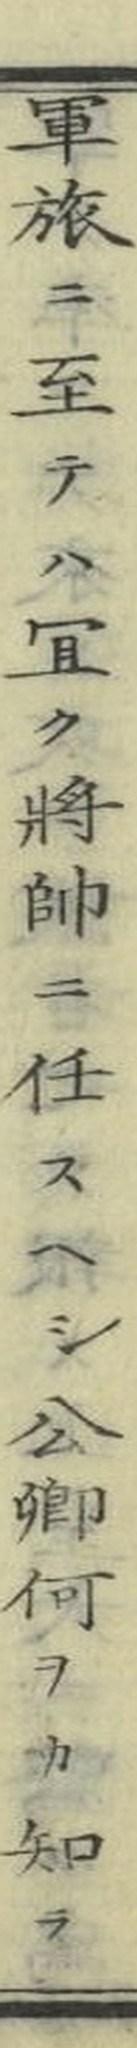軍旅ニ至テハ冝ク將帥ニ任スヘシ公卿何ヲカ知ラ
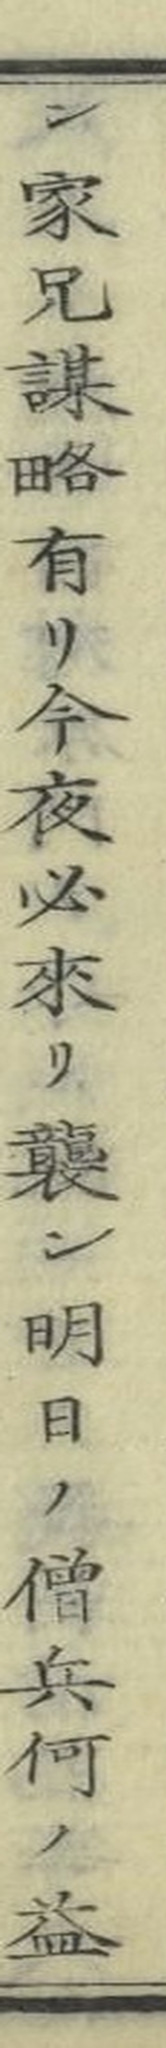ン家兄謀略有リ今夜必來リ襲ン明日ノ僧兵何ノ益
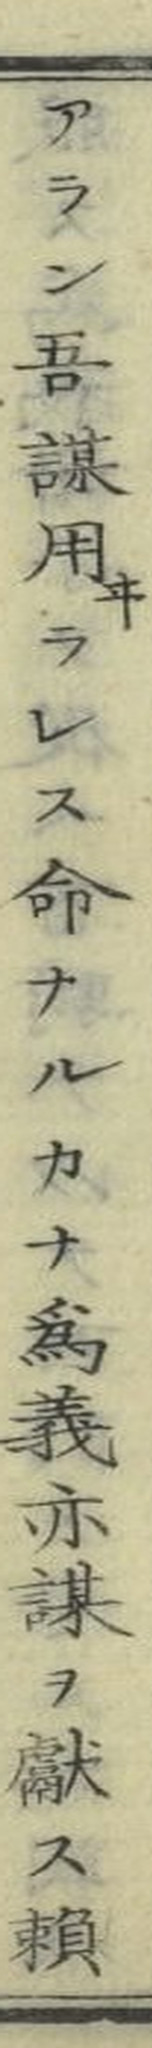アラン吾謀用ラレス命ナルカナ爲義亦謀ヲ獻ス頼
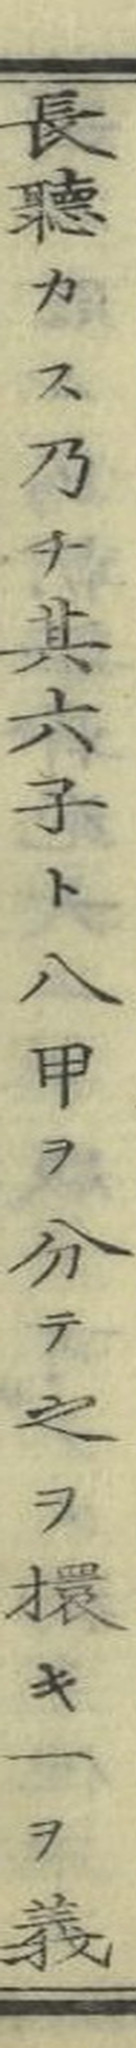長聽カス乃チ其六子ト八甲ヲ分テ之ヲ擐キ一ヲ義

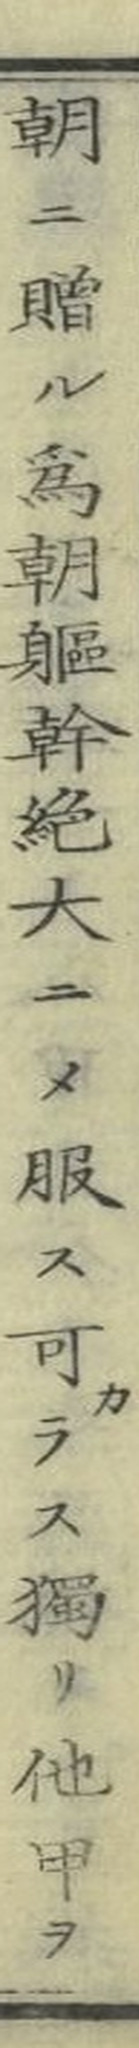朝ニ贈ル爲朝軀幹絕大ニ乄服ス可ラス獨リ他甲ヲ
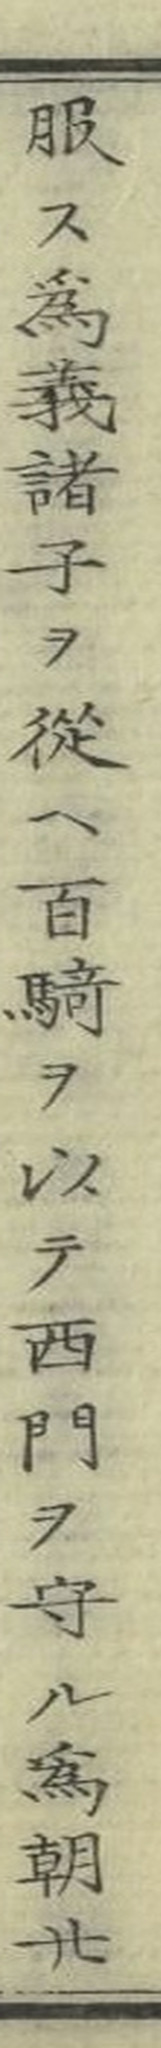服ス爲朝諸子ヲ從ヘ百騎ヲ以テ西門ヲ守ル爲朝廿
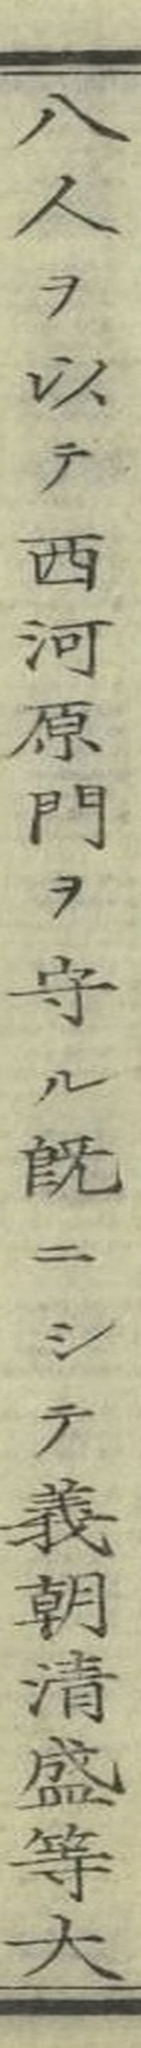八人ヲ以テ西河原門ヲ守ル既ニシテ義朝清盛等大
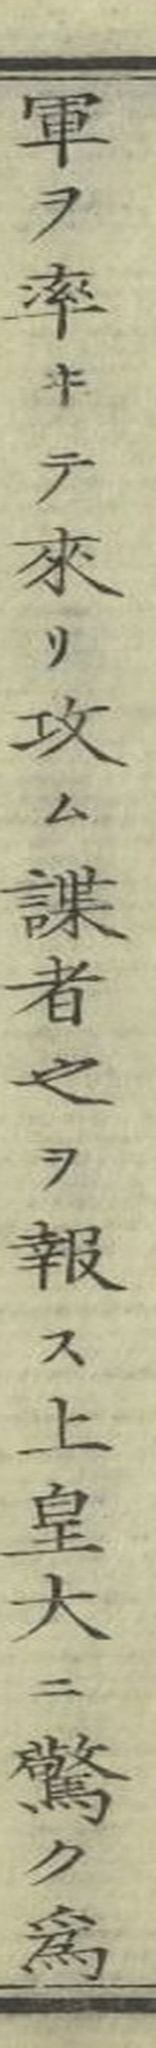軍ヲ率キテ來リ攻ム諜者之ヲ報ス上皇大ニ驚ク爲
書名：琉球藩史 一之巻
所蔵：University of the Ryukyus Library
